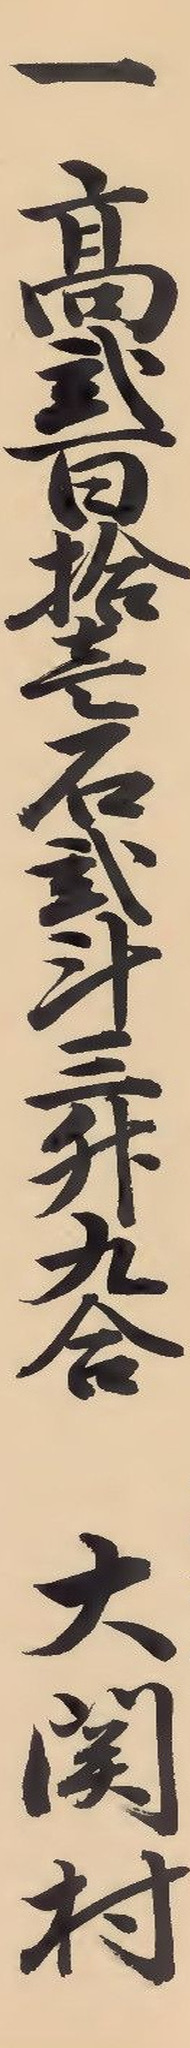一高弐百拾壱石弐斗三升九合大関村
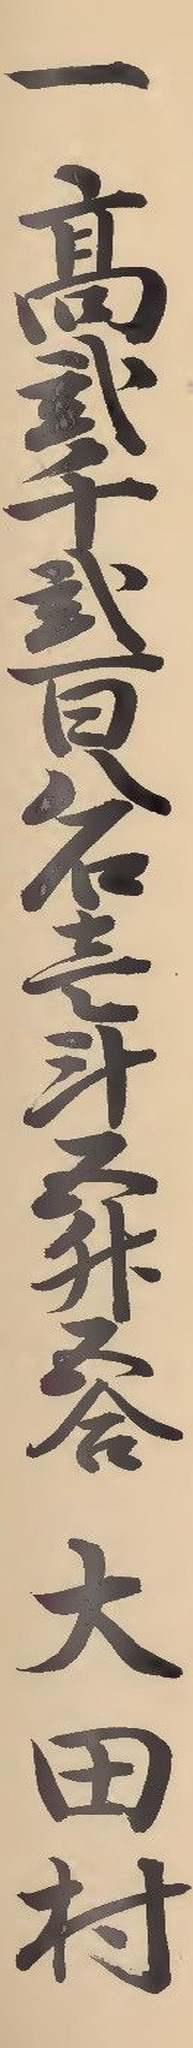一高弐千弐百八石壱斗五升五合大田村
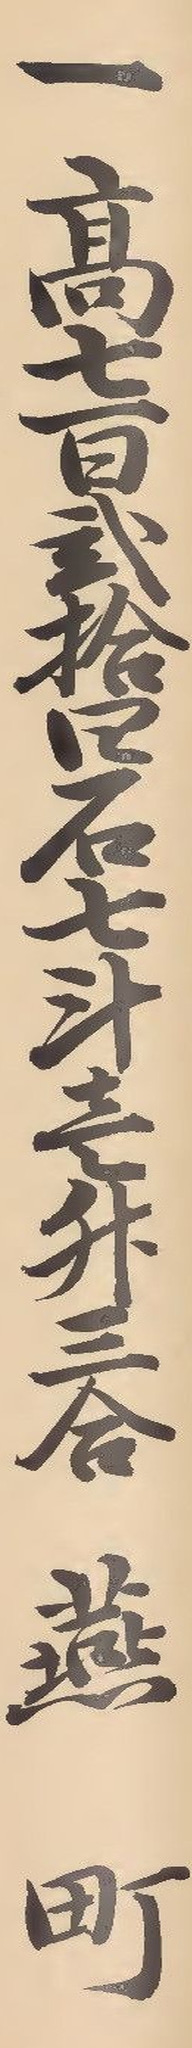一高七百弐拾四石七斗壱升三合燕町
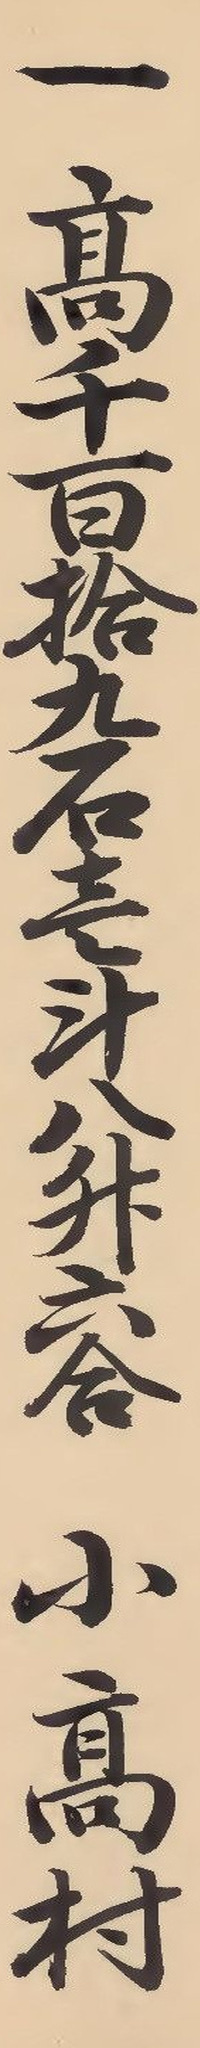一高千百拾九石壱斗八升六合小高村
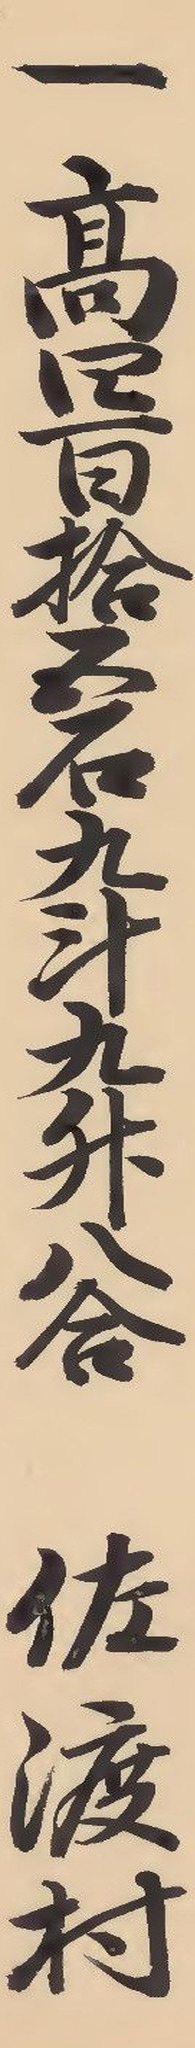一高四百拾五石九斗九升八合佐渡村
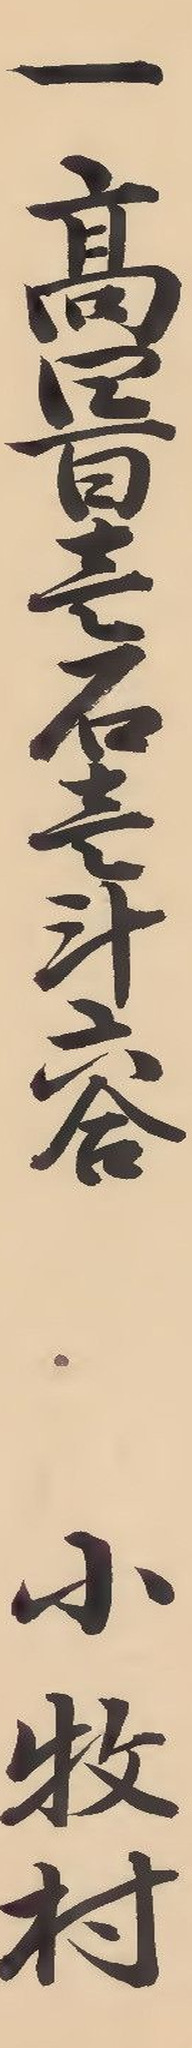一高四百壱石壱斗六合小牧村

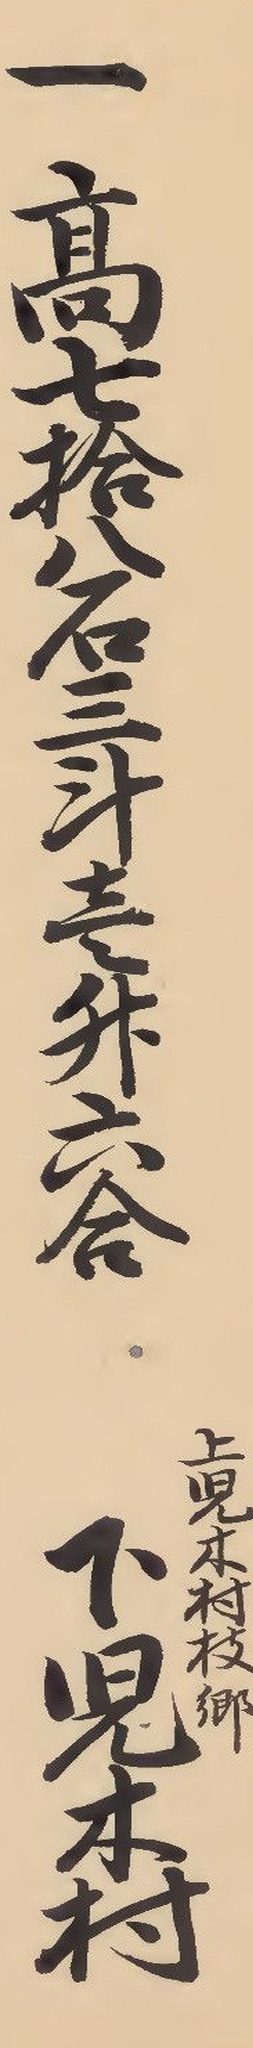一高七拾八石三斗壱升六合下児木村
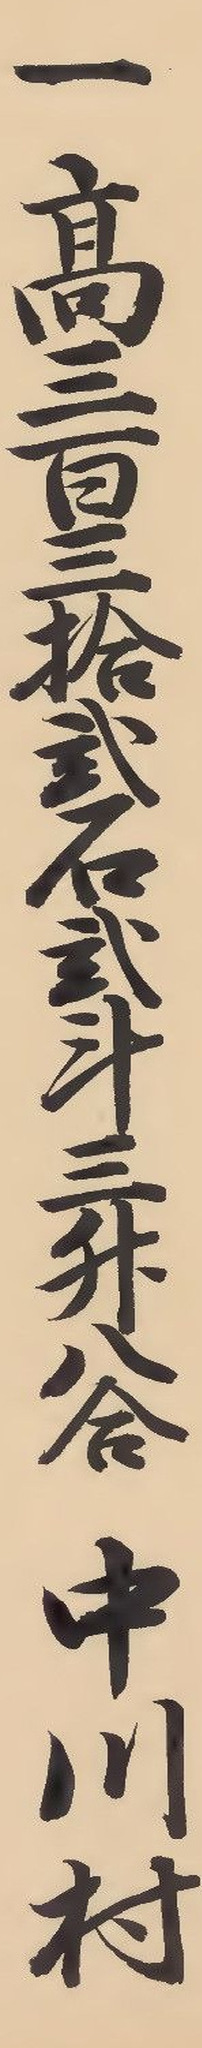一高三百三拾弐石弐斗三升八合中川村
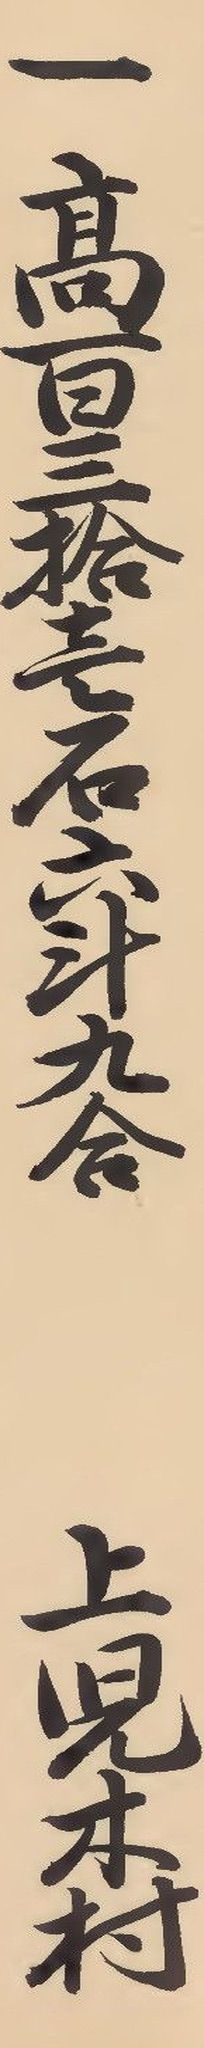一高百三拾壱石六斗九合上児木村
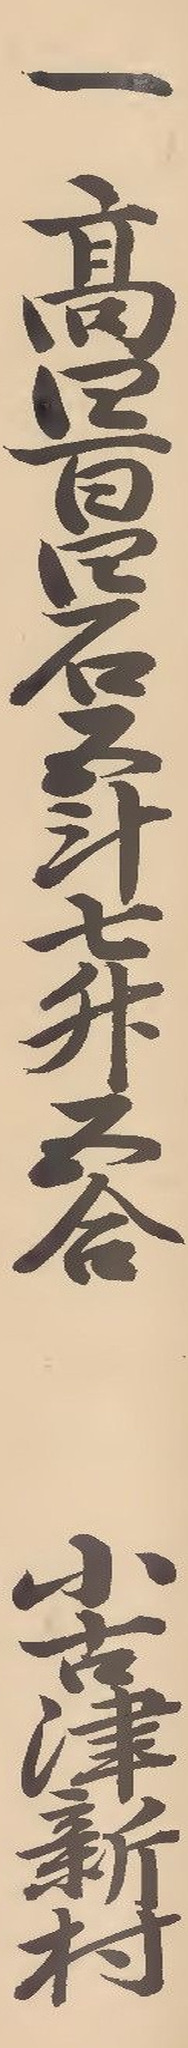一高四百四石五斗七升五合小古津新村
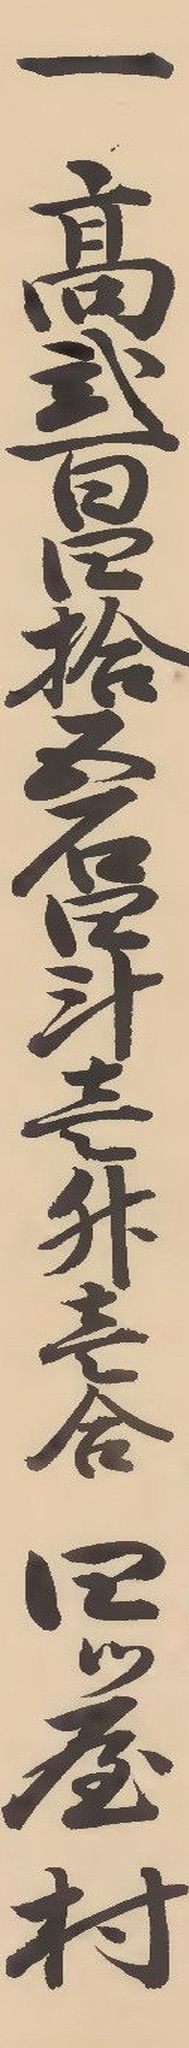一高弐百四拾五石四斗壱升壱合四ッ屋村
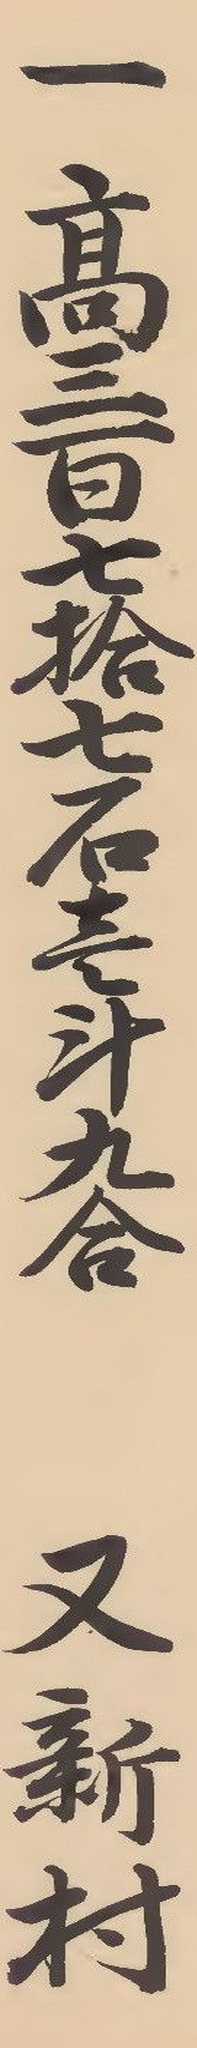一高三百七拾七石壱斗九合又新村
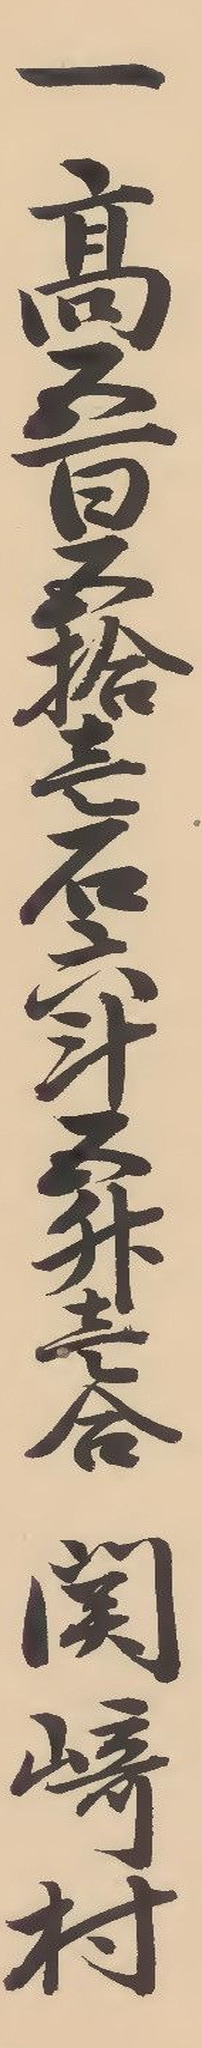一高五百五拾壱石六斗五升壱合関崎村

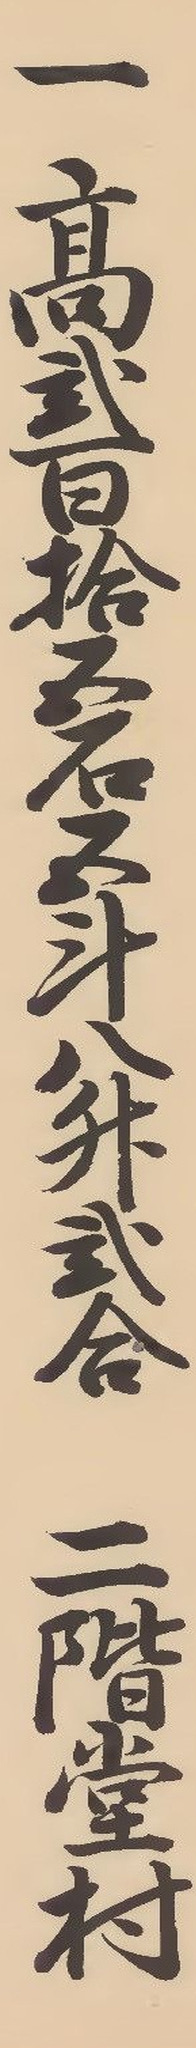一高弐百拾五石五斗八升弐合二階堂村
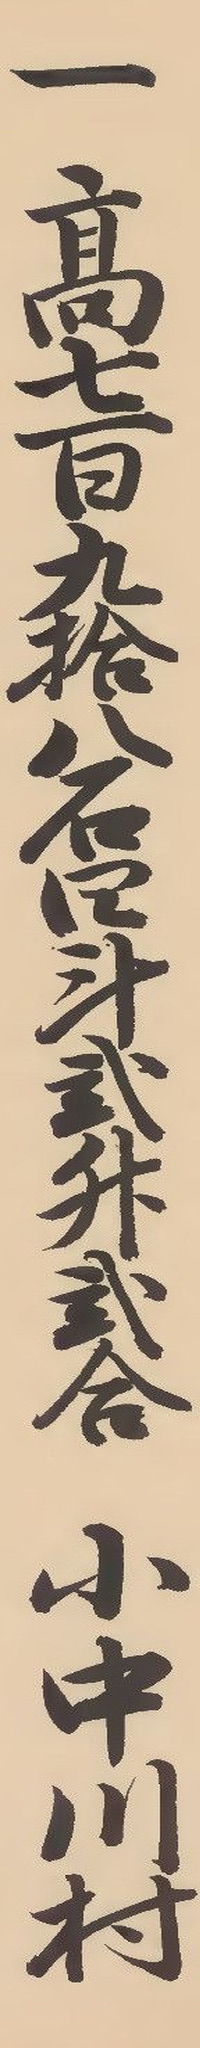一高七百九拾八石四斗弐升弐合小中川村
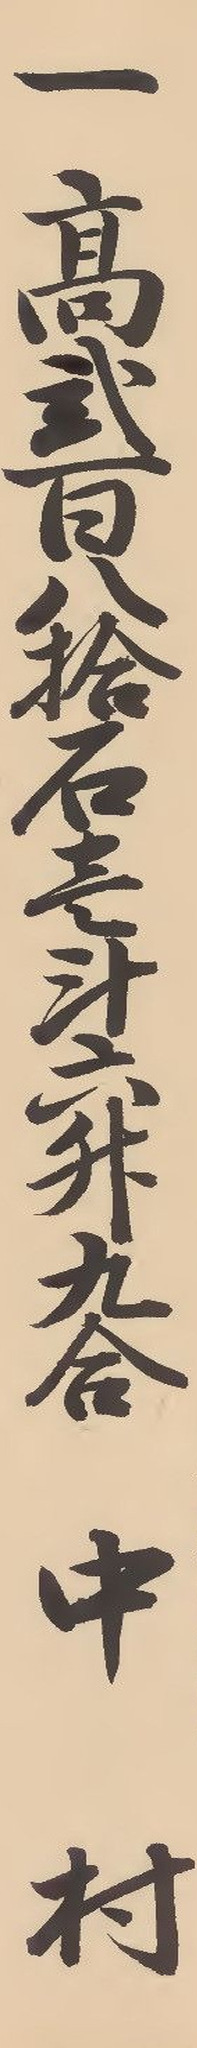一高弐百八拾石壱斗六升九合中村
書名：越後国郷帳　下
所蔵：国立公文書館 National Archives of Japan
